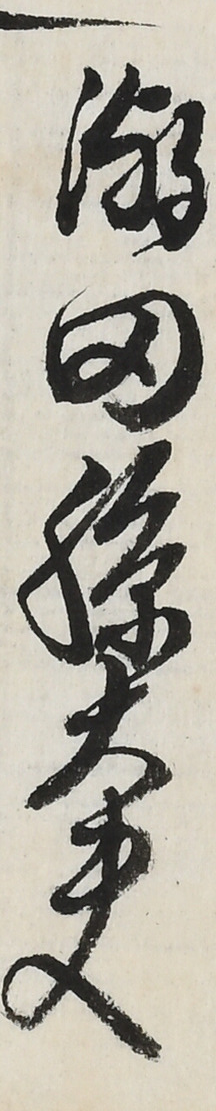潮田孫太夫
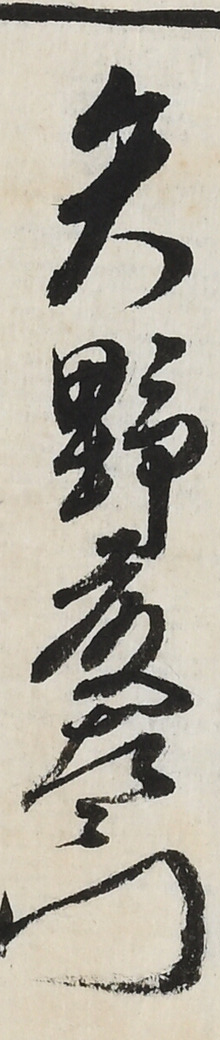矢野藤左衛門
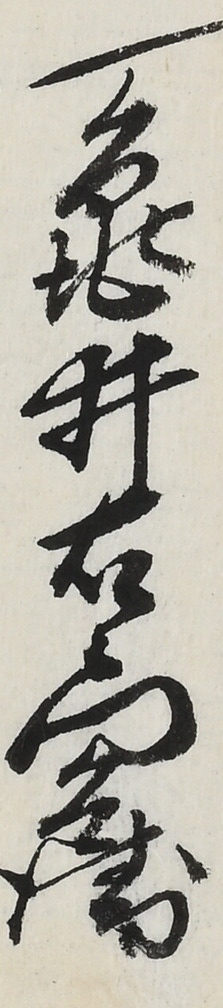亀井右衛門兵衛
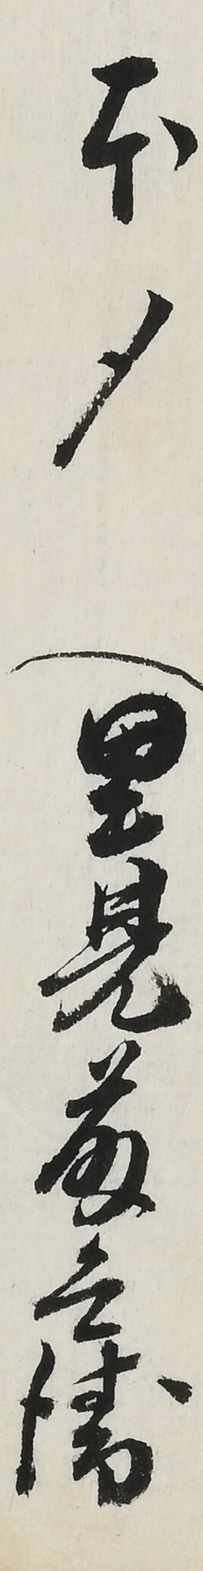本〆里見藤兵衛
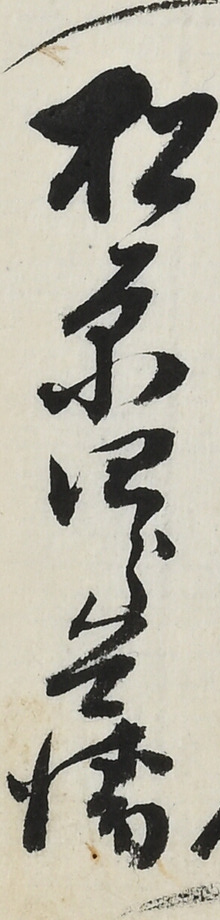松原四郎兵衛
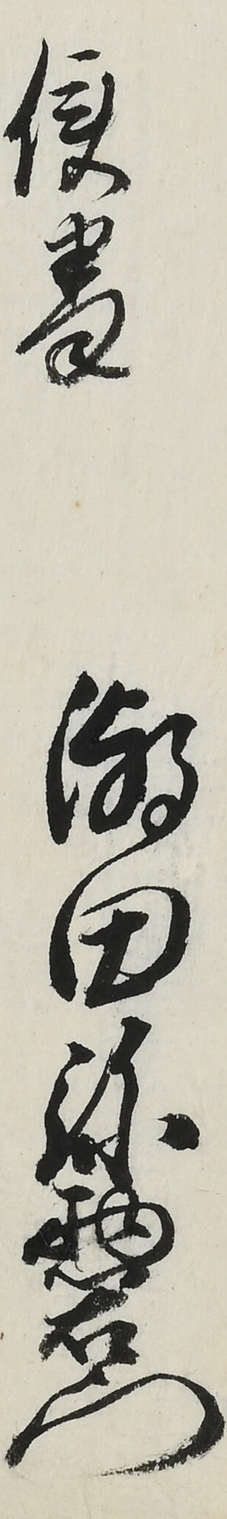使番潮田弥惣右衛門

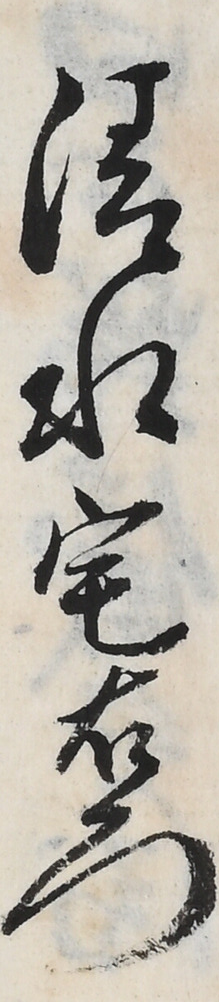清水新左衛門
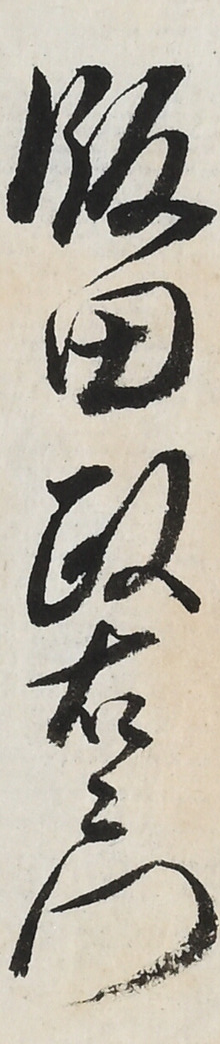飯田政右衛門
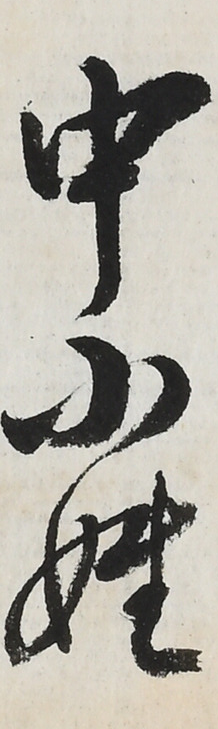中小姓
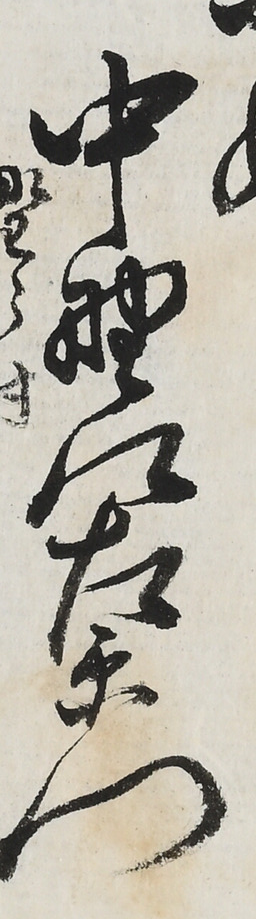中野郷左衛門
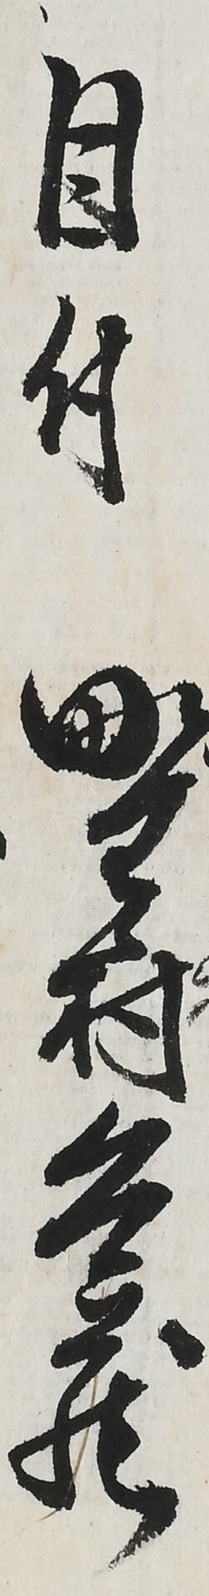目付野々村兵蔵
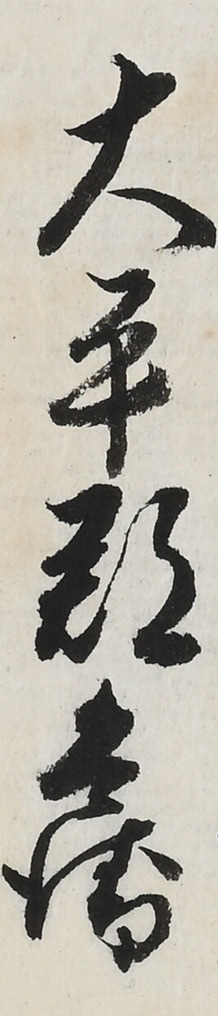大平郡兵衛
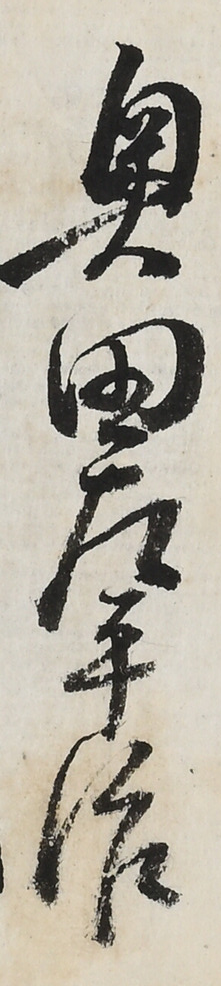奥田左平治
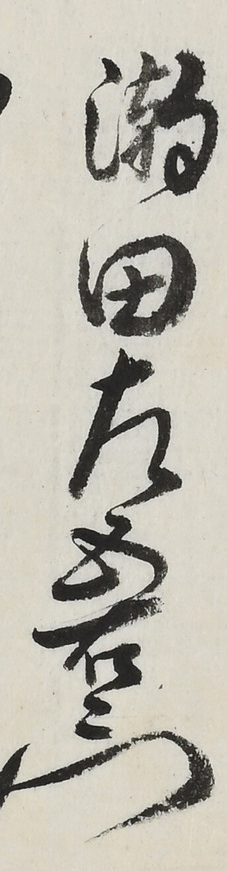潮田左五右衛門
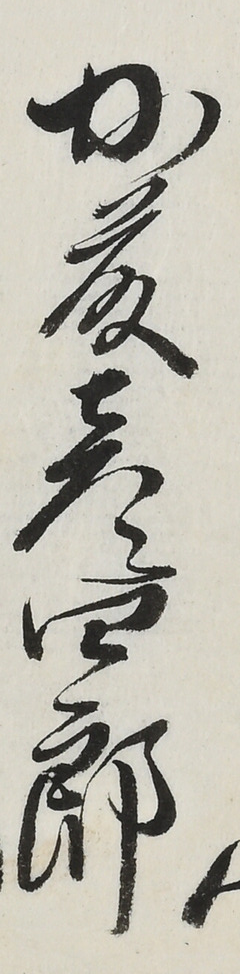加藤彦四郎
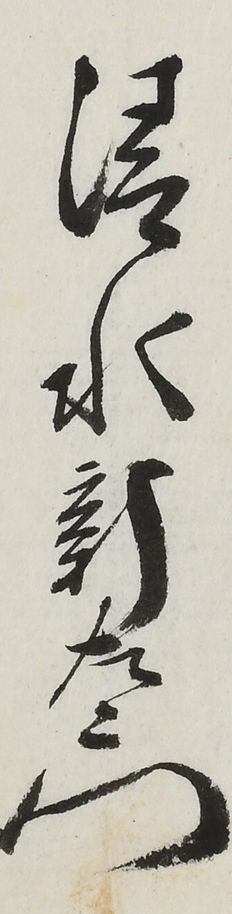清水新左衛門
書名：高遠江戸徒以上之面々
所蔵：伊那市立高遠町図書館・合同会社AMANE
